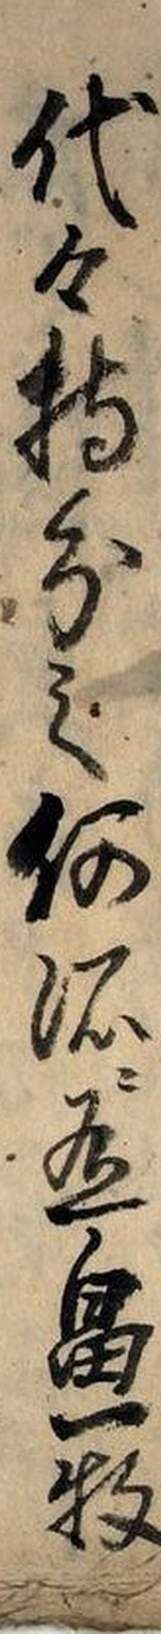代々持分之何所ニ有畠一枚
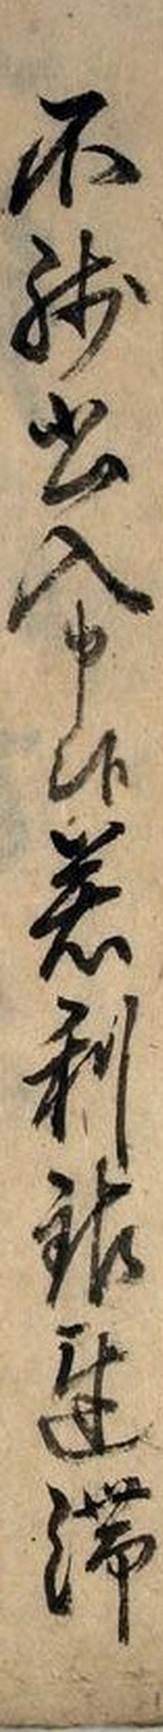不残出入申候若利銀遅滞
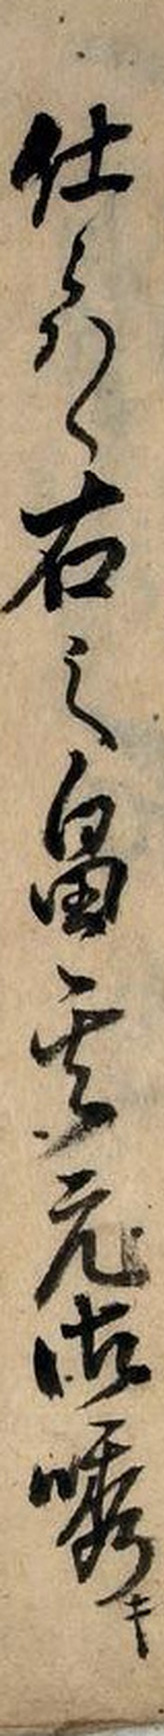仕候ハヽ右之畠其元御唀キ
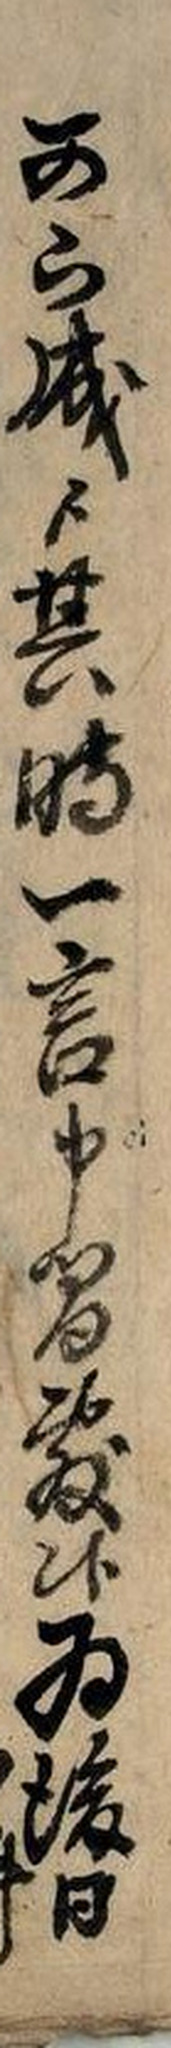可被成候其時一言申間敷候為後日
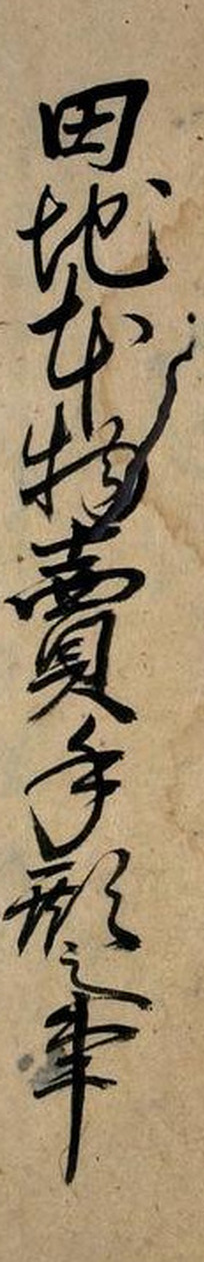田地本物売手形之事
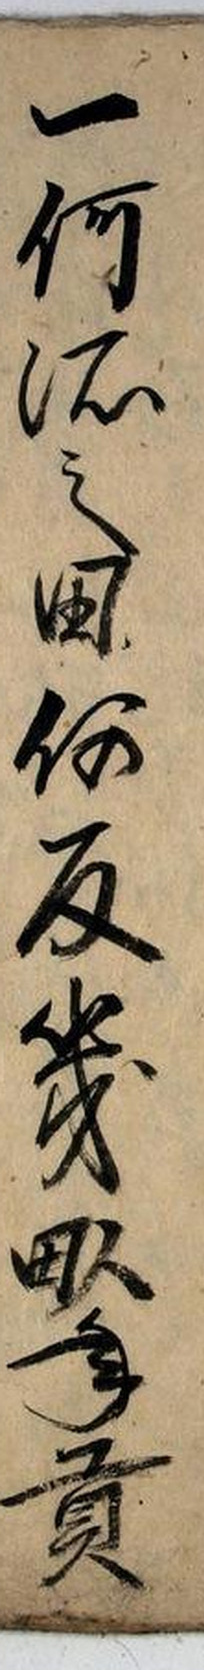一何所之田何反幾畝年貢
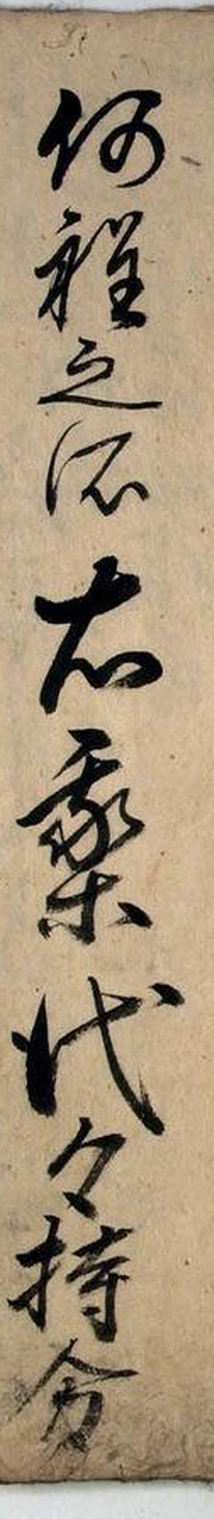何程之所右我等代々持分

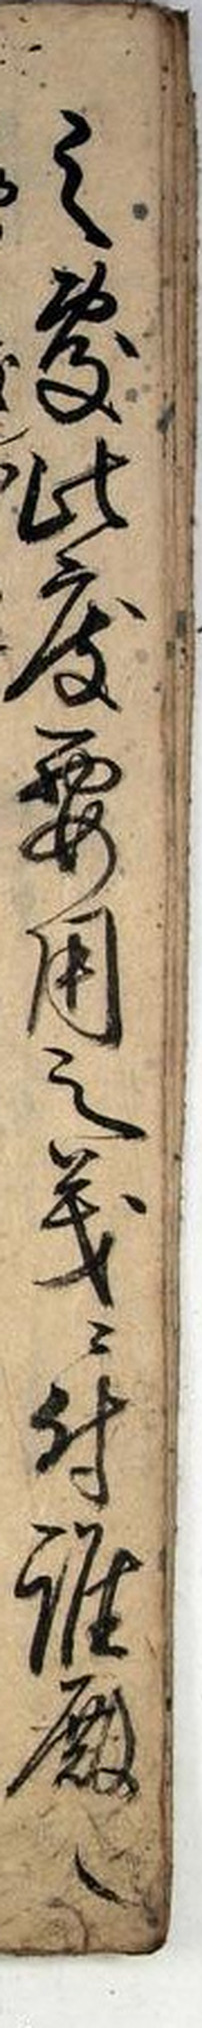之処此度要用之義ニ付誰殿へ
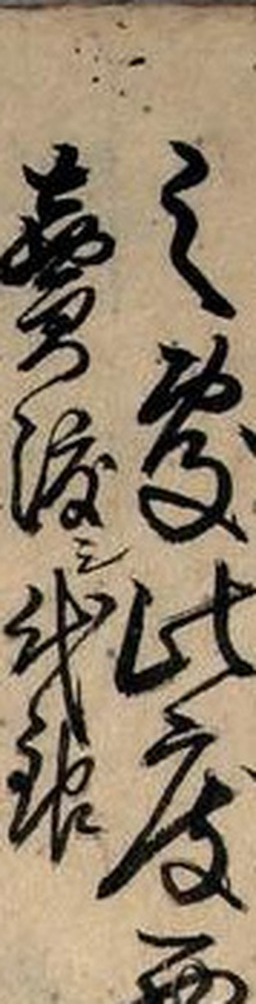売渡シ代銀
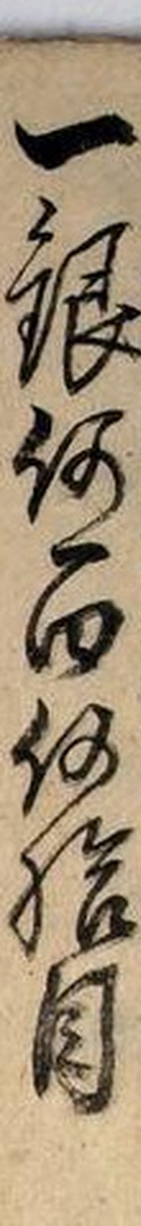一銀何百何拾目
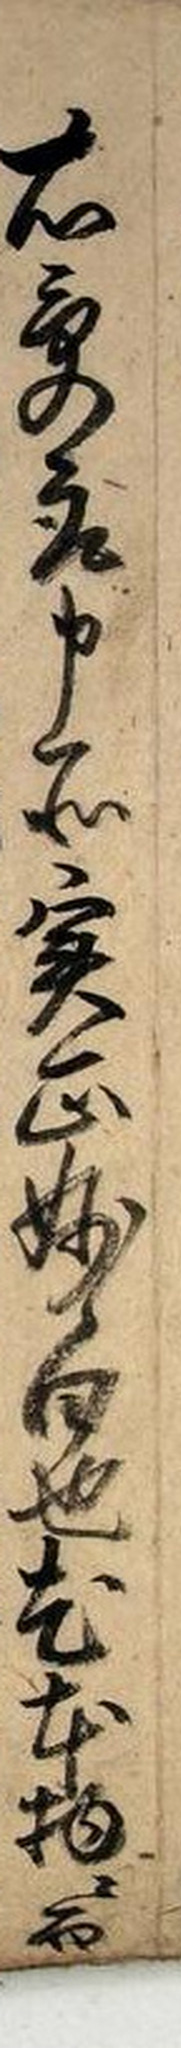右受取申所実正妙白也尤本物ニ而
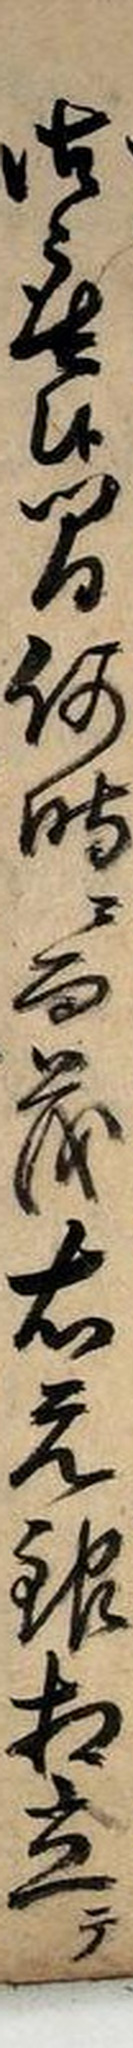御座候間何時ニ而も右元銀相立テ
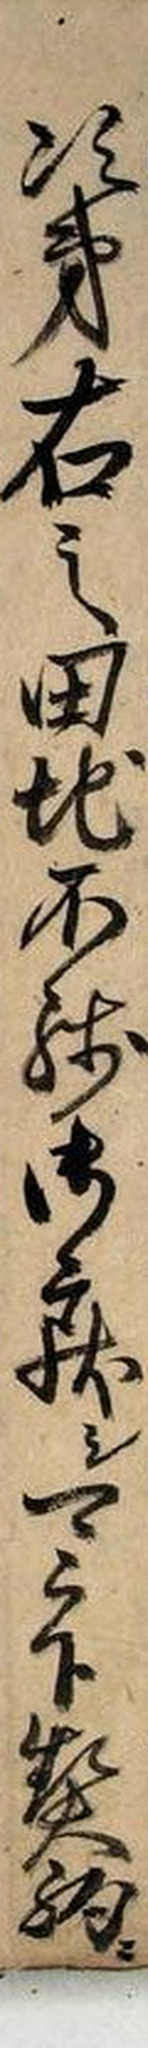次第右之田地不残御戻シ可被下契約ニ
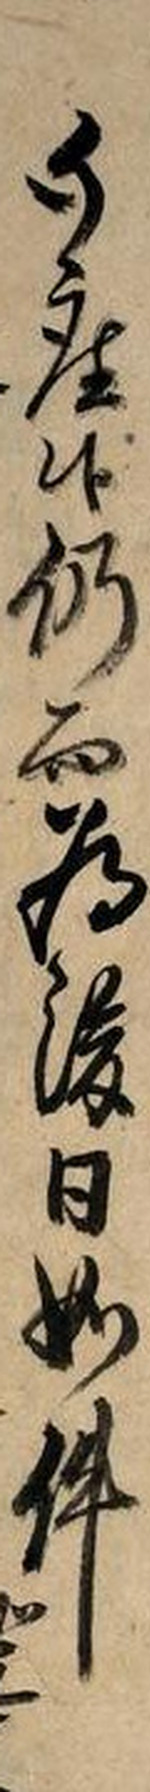御座候仍而為後日如件
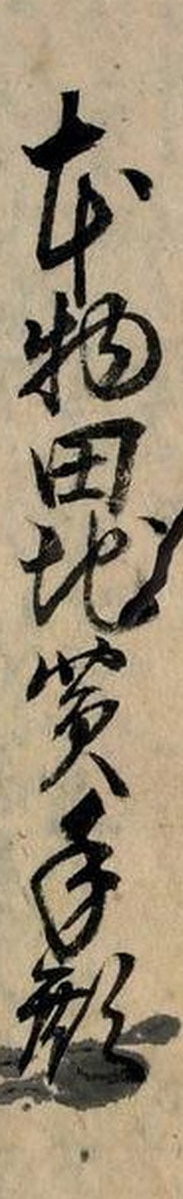本物田地買手形
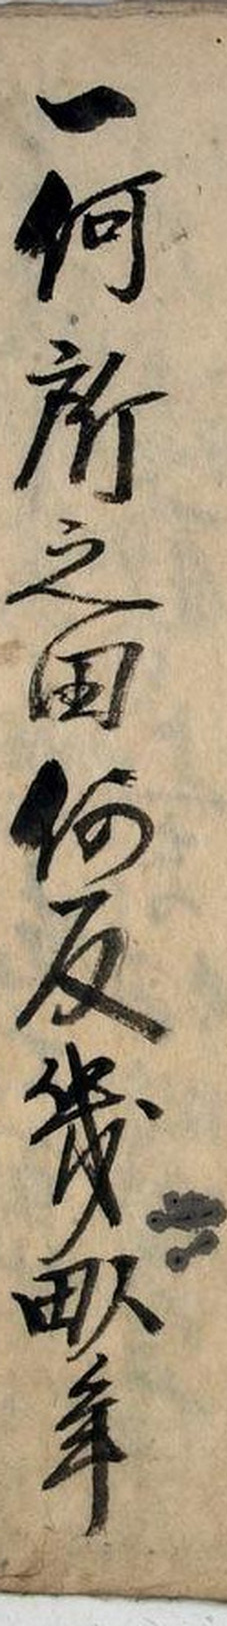一何所之田何反幾畝年
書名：証文御手本（手習）
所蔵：福井県文書館 Fukui Prefectural Archives
